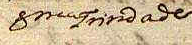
Sma Trindade
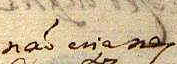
naõ cria nos
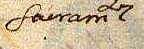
sacramtos
